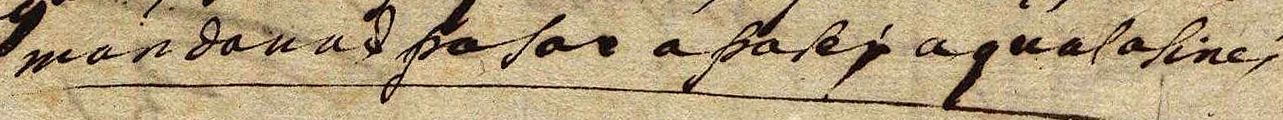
mandauaõ pasar a pasej a qual asinej
